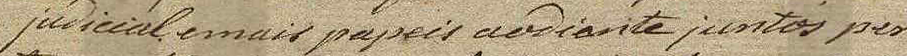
judicial e mais papeis ao diante juntos per
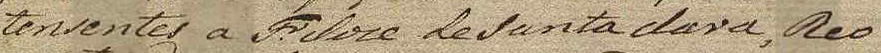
tensentes a F.r loze de Santa clara, Reo
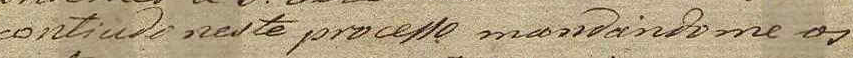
conteudo neste processo mandandome os
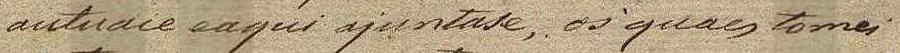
autuace e aqui ajuntase, os quaes tomei
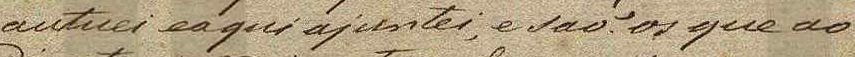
autuei e aqui ajuntei, e saõ os que ao
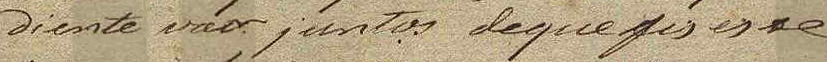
diante vaõ juntos de que fis este
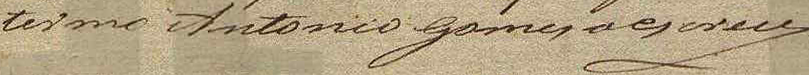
termo Antonio Gomes o escreuj
